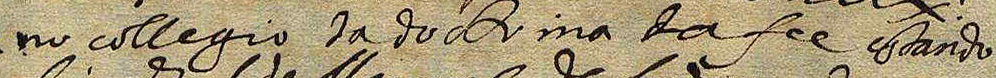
no collegio da doctrina da fee estando
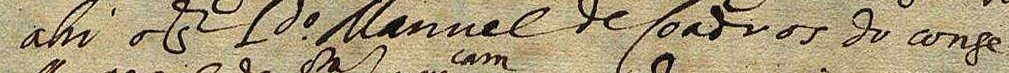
ahi o sor Ldo. Manuel de Coadros do conse
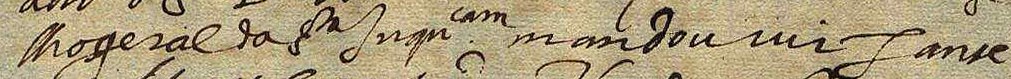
lho geral da sta Jnqu.çam mandou uir ꝑante
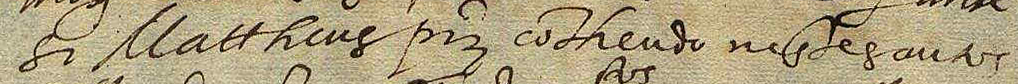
si Mattheus piz̄ cōtheudo nestes autos
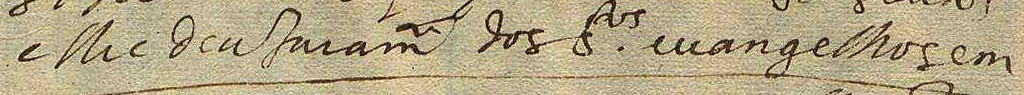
e lhe deu Iuramto dos stos. euangelhos em
